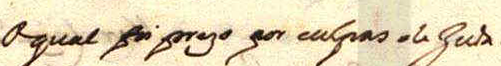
O qual foi prezo por culpas de Juda
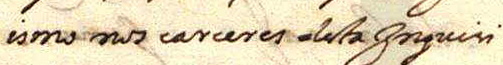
ismo nos carceres desta Jnquisi
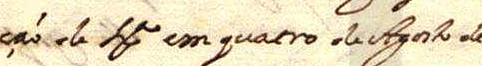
çaõ de Lxa em quatro de Agosto de
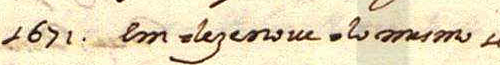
1671. em dezenove do mesmo se
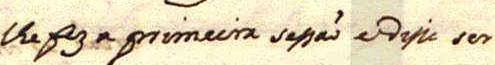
lhe fez a primeira sessaõ e disse ser
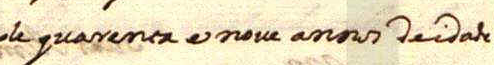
de quarenta e noue annos de idade
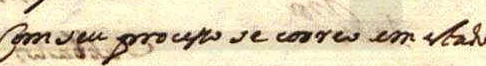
Com seu processo se correo em estado
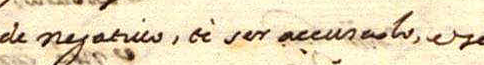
de negatiuo, té ser accusado, e se
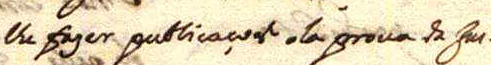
lhe fazer publicaçoes da proua da Jus
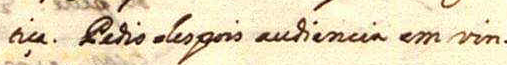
tiça. Pedio despois audiencia em vin
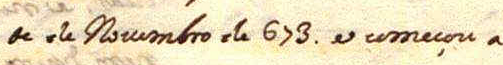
te de Nouembro de 673. e começou a
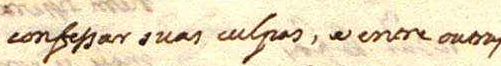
confessar suas culpas, e entre outras
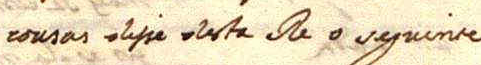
cousas disse desta Re o seguinte
